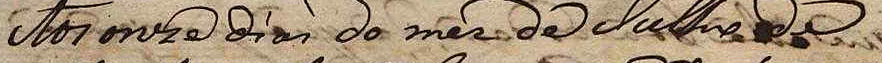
Aos onze dias do mez de Iulho de
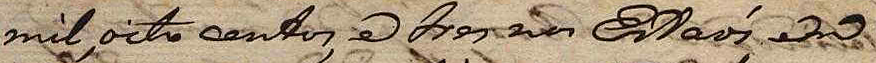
mil, oitocentos, e tres nos Estaós em
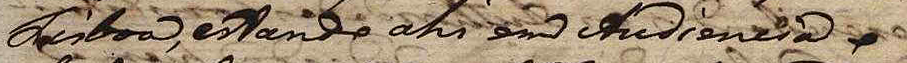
Lisboa, estando ahi em Audiencia o
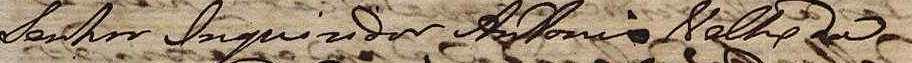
Senhor Inquizidor Antonio Velho da
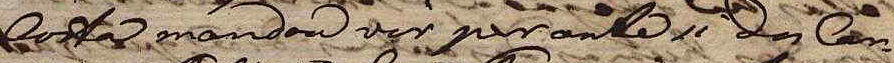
Costa mandou vir perante si dos Car
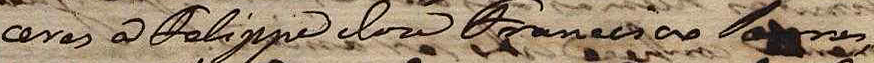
ceres a Felippe Ioze Francisco so_res,
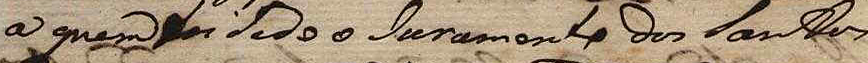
a quem foi dado o Iuramento dos santos
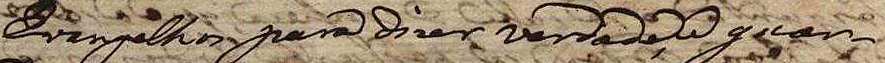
Evangelhos para dizer verdade e guar
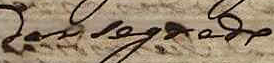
dar segredo
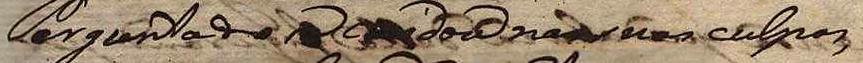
Perguntado s_ c_ idou na_ suas culpas,
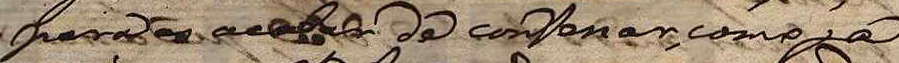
para as acabar de confessar, como ja
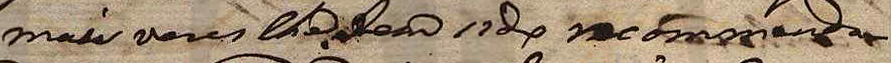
mais vezes lhe tem sido r_commenda
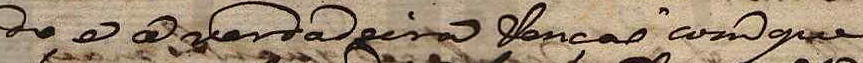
do, e a verdadeira tençaõ com que
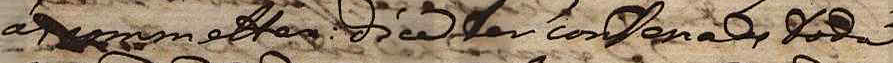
as commetteo: dice ter confessado toda
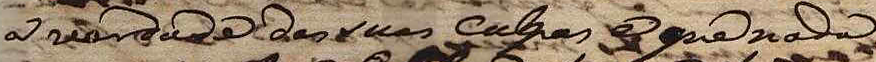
a verdade das suas culpas, e que nada
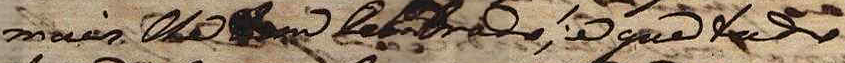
mais lhe __m lembrado, e que tudo
